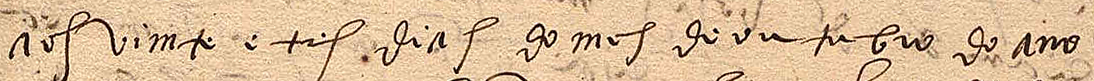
aos vimte e tres dias do mes de outubro do ano
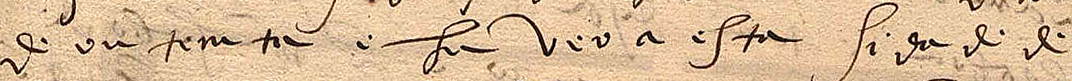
de outemta e hū veo a esta sidade de
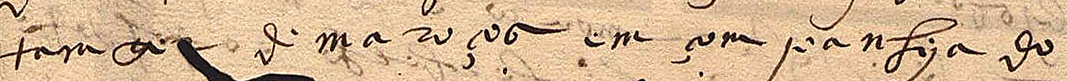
tamger de marocos em companhya do
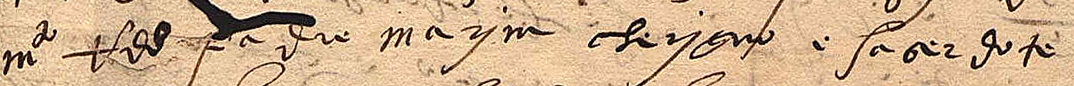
mto Rdo padre marjm clerjguo e saserdote
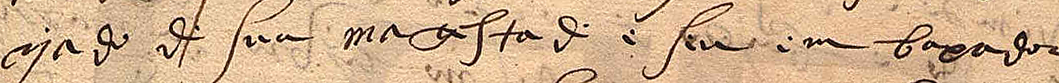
crjado de sua magestade e seu embaxador
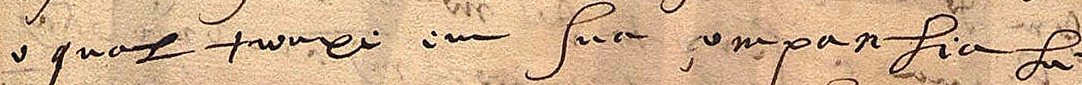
o qual trouxe em sua companhia hū
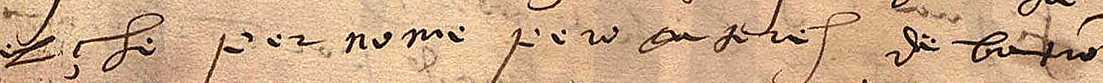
elche per nome pero gauteres de butrō
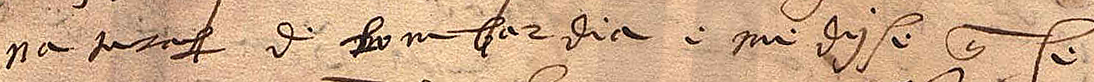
natural de lombardia e me dyse q̄ se
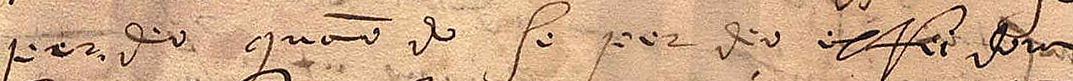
perdeo quãodo se perdeo el Rei dom
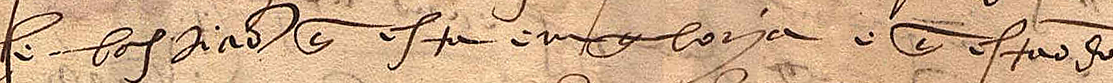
sebastiaõ q̄ esta em glorja e q̄ estãodo
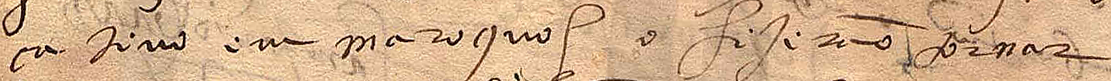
catiuo em maroquos o fizerão tornar
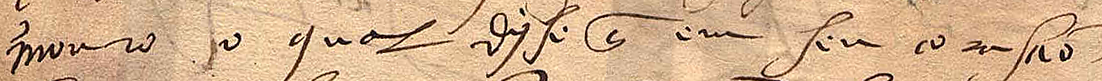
mouro o qual dyse q̄ em seu corasaõ
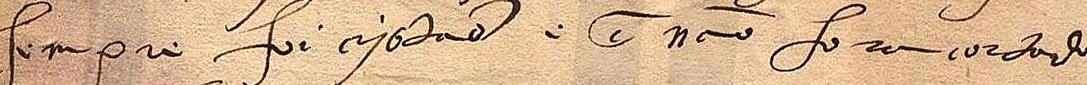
sempre foi crjstaõ e q̄ não fora cortado
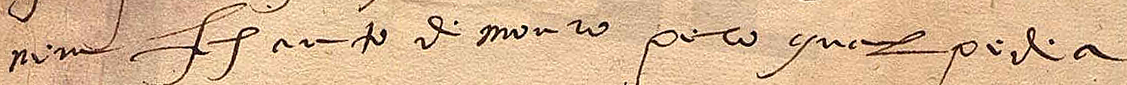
nem fes auto de mouro pelo qual pede a
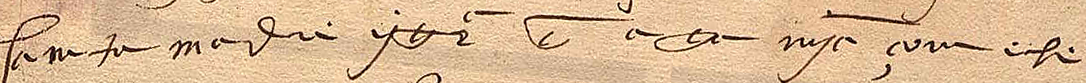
samta madre ygra q̄ aga mj̄a com ele
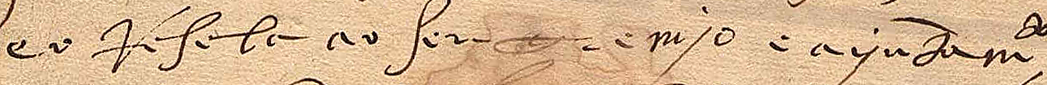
e o Reseba ao seu gremjo e ayūtamto
